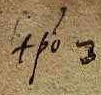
tpō 3
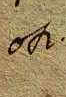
o R
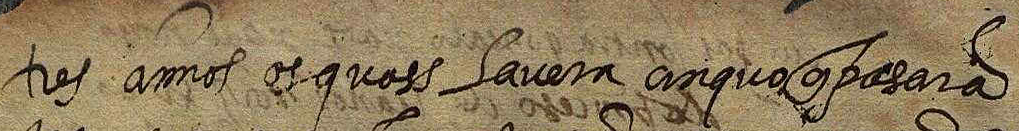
tres annos os quaes hauera cinquo q̄ pasaraõ
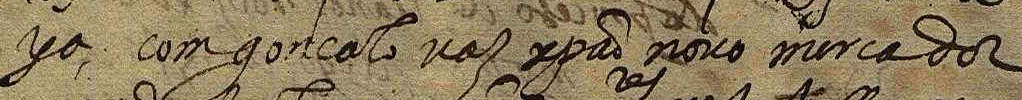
ya com gonçalo uaz xpão nouo mercador
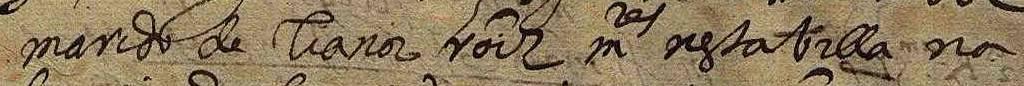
marido de lianor roīz mres nesta villa na
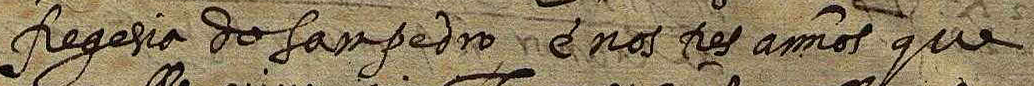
fregesia do sam pedro, e nos tres ann̄os que
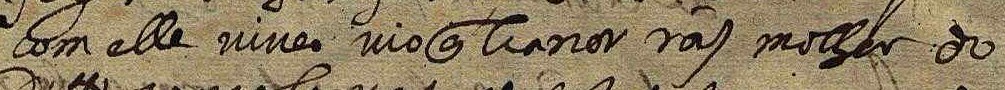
com elle uiue uio q̄ lianor roīz molher do
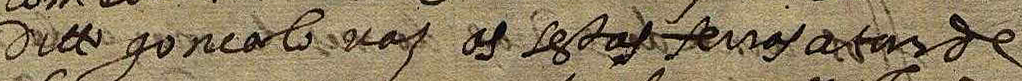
ditto gonçalo uaz as sestas feiras a tarde
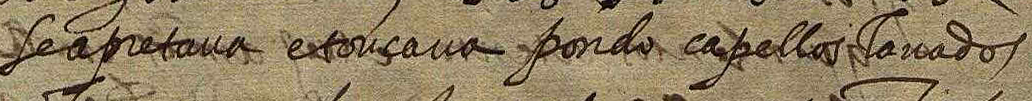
se apretaua e toucaua pondo capellos lauados
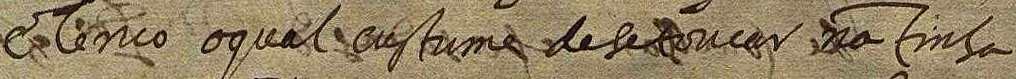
e lenço o qual custume de se toucar nā tinha
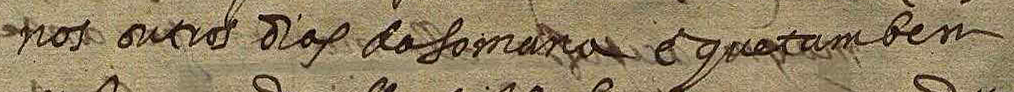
nos outros dias da somana e que tambem
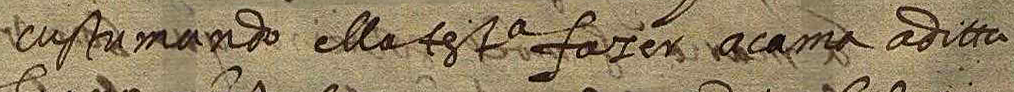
custumando ella testa fazer a cama a ditta
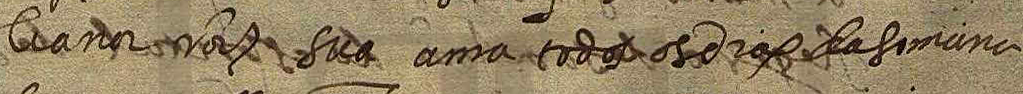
lianor roīz sua ama todos os dias da somana
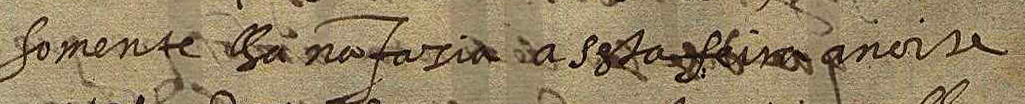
somente lha não fazia a sesta feira a noite
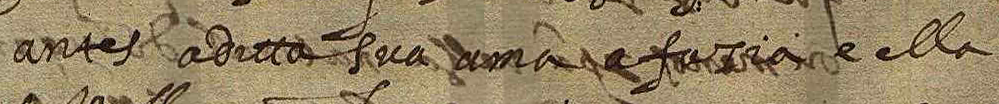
antes a ditta sua ama a fazia e ella
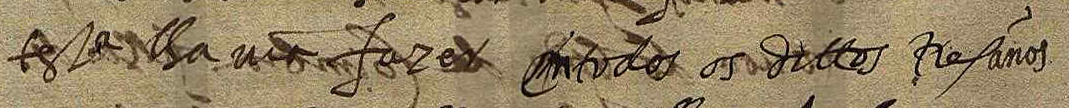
testa lha uia fazer em todos os dittos tres an̄os
